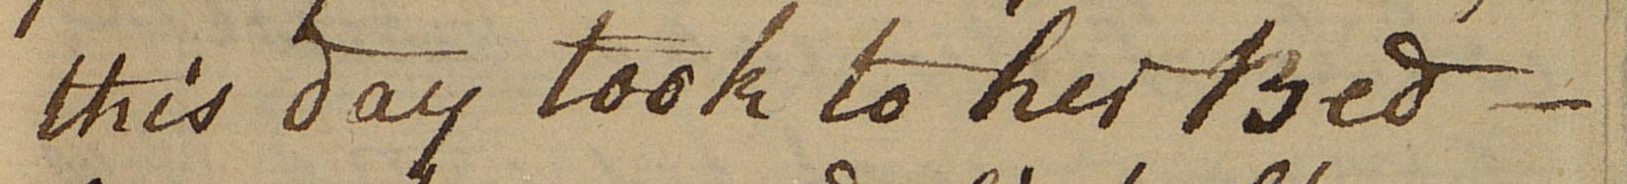this day took to her Bed-
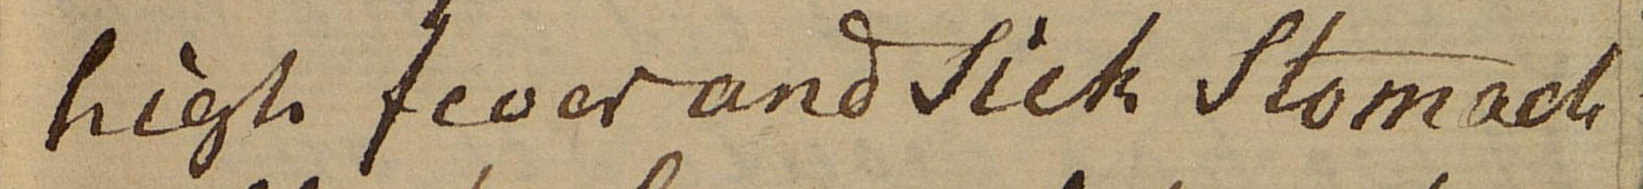high fever and Sick Stomach
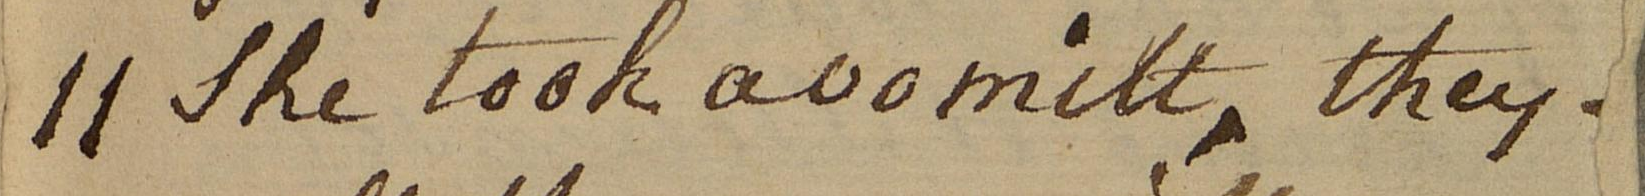11 she took a vomitt, they
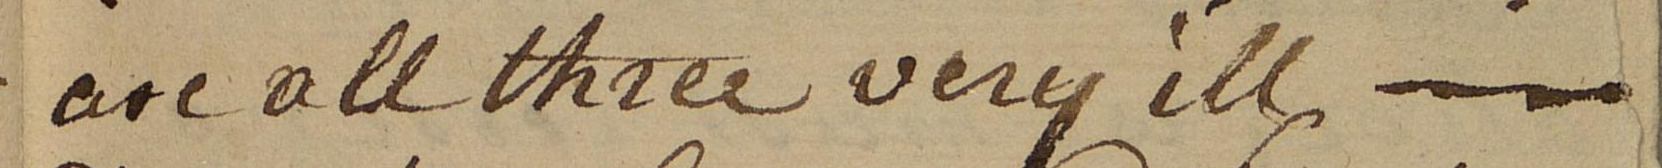are all three very ill-
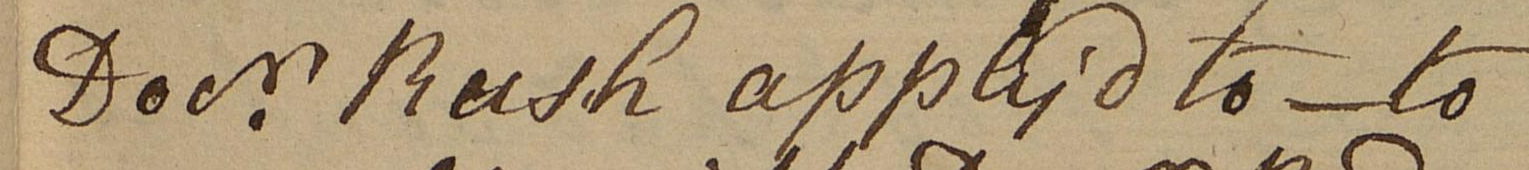Doc^r Rush apply'd to- to
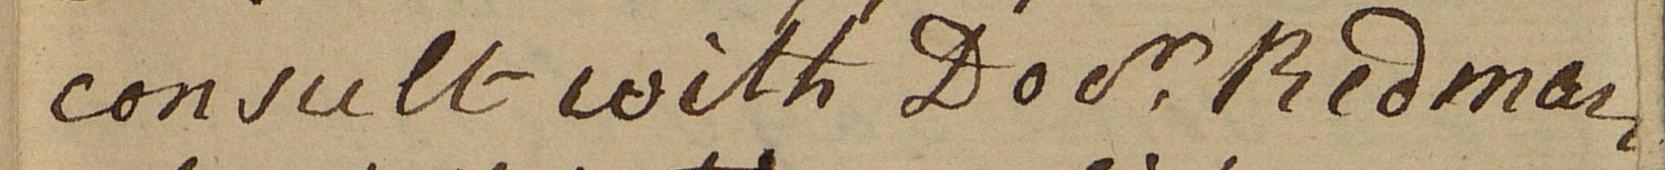consult with Doc^r. Redman
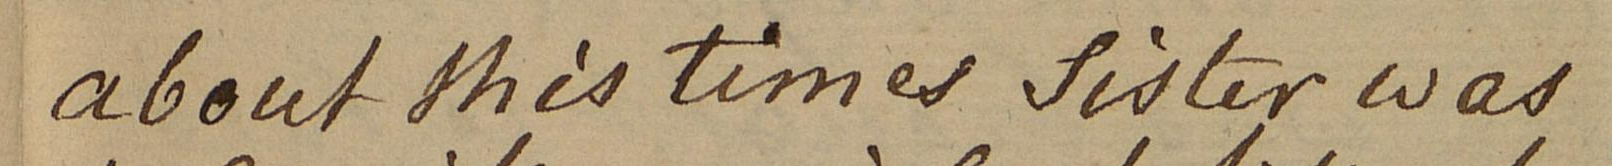about this times Sister was
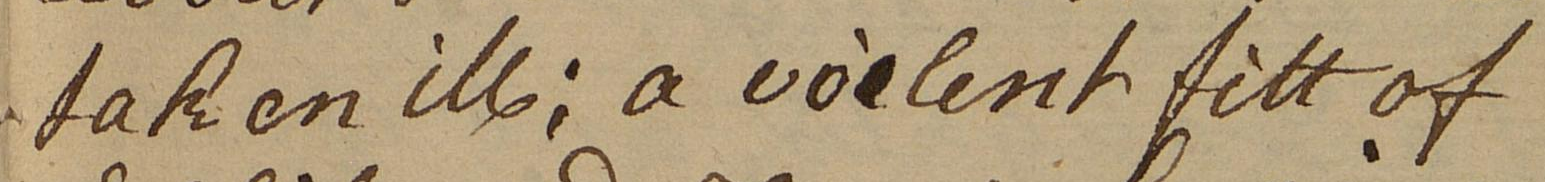taken ill; a violent fitt of
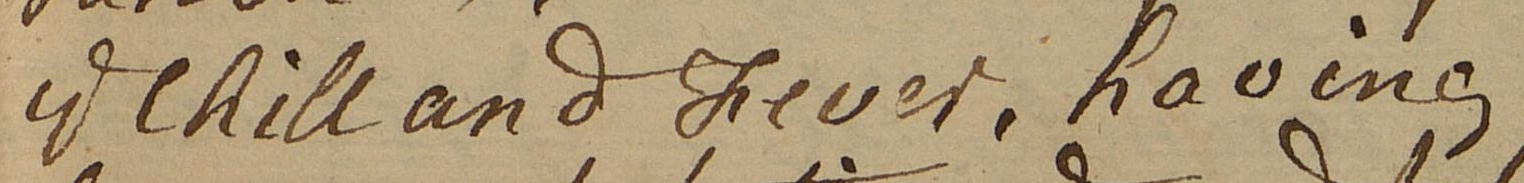y^e chill and Fever, having
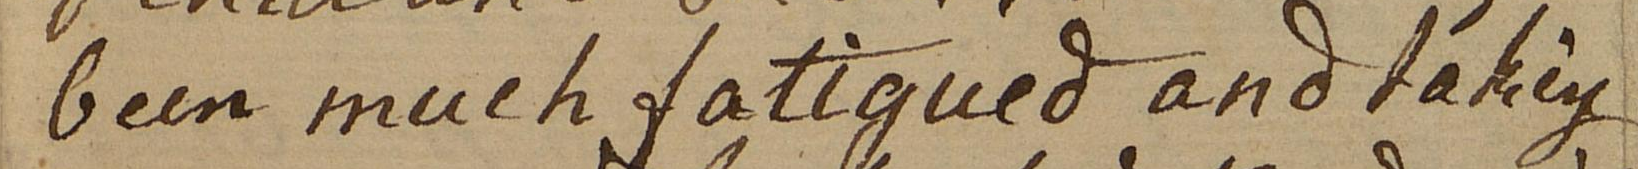been much fatigued and takig
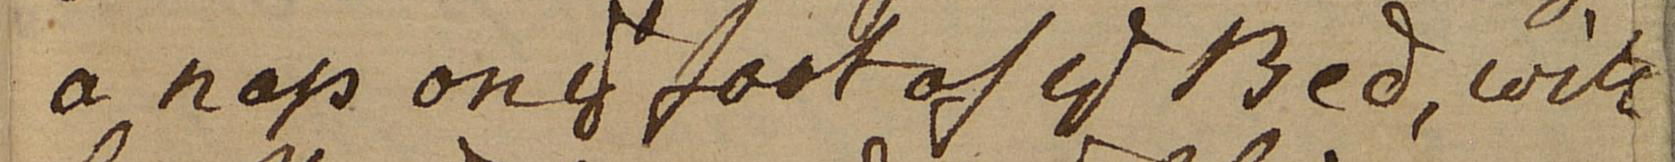a nap on y^e foot of y^e Bed, with
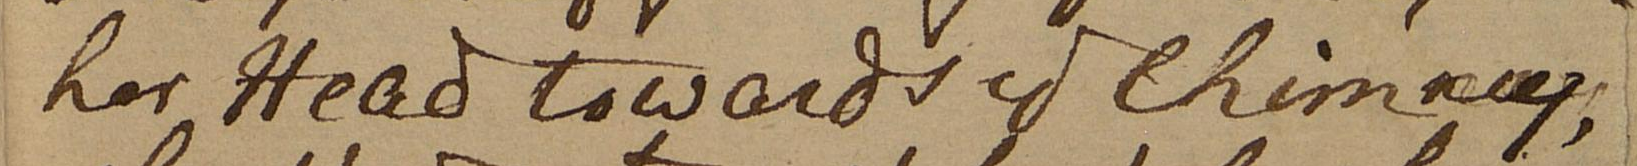her Head towards y^e Chimney,
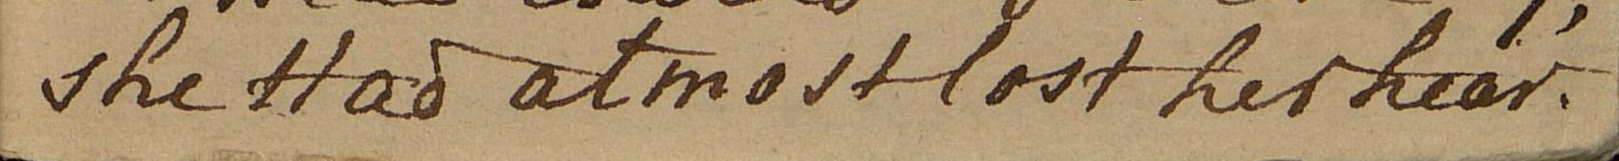she Has atmost lost her hear-
